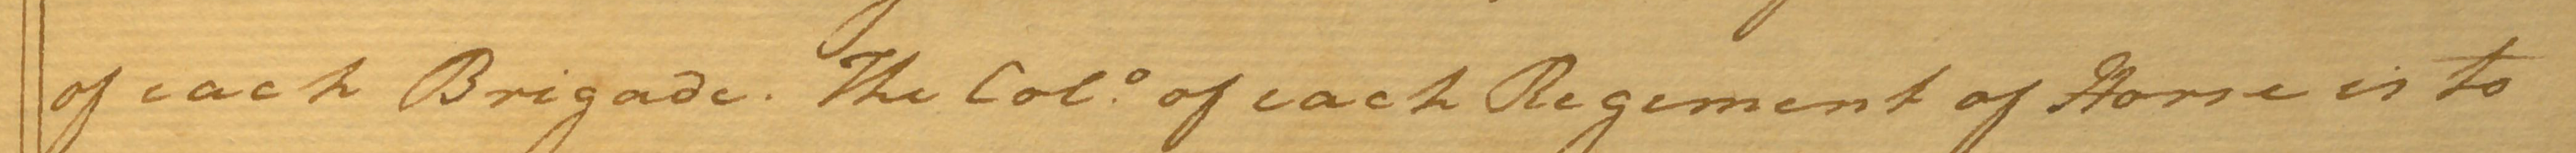of each Brigade. The Col^o. of each Regiment of Horse is to
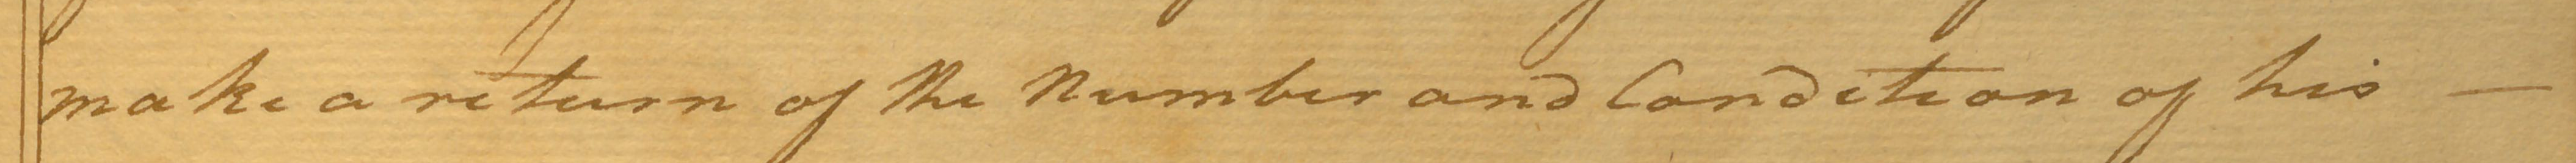make a return of the number and Condition of his
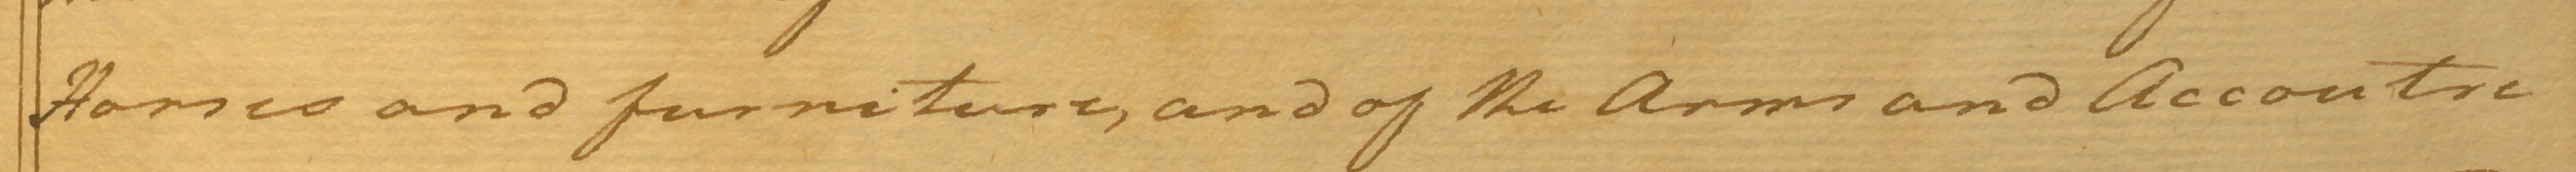Horses and furniture, and of the Arms and Accoutre
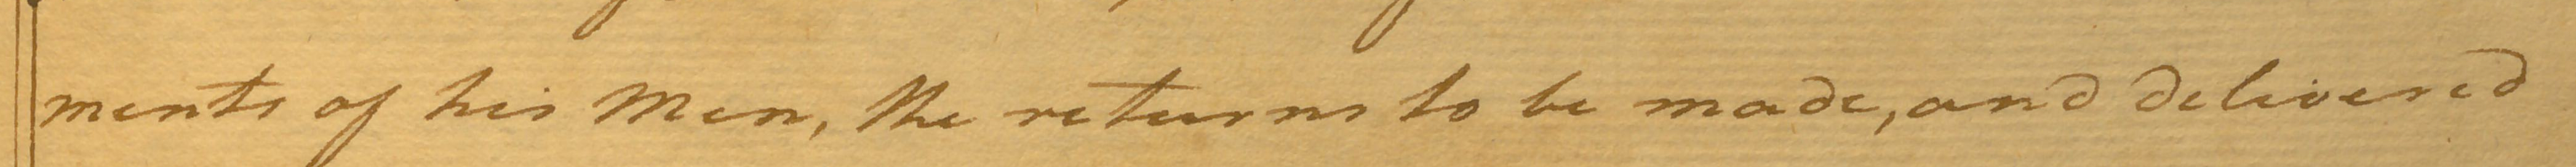ments of his men, the returns to be made, and delivered
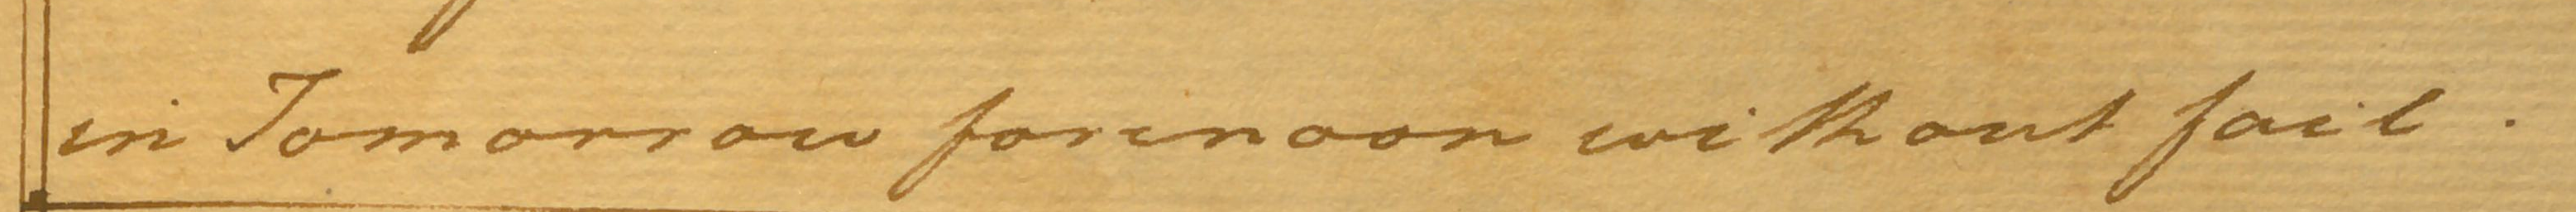in Tomorrow forenoon without fail.
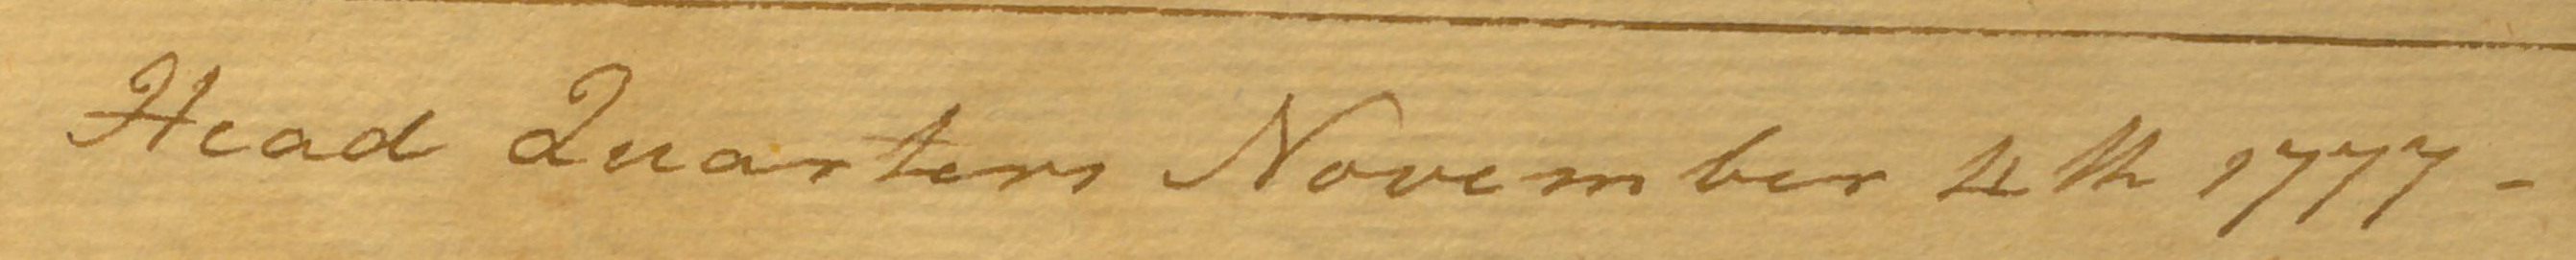Head Quarters November 4^th 1777-
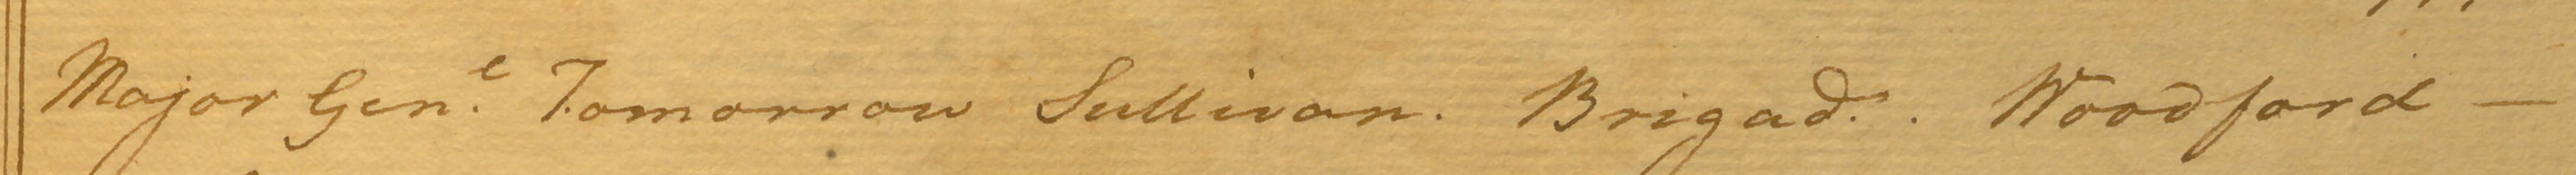Major Gen^l. Tomorrow Sullivan. Brigad^r. Woodford-
